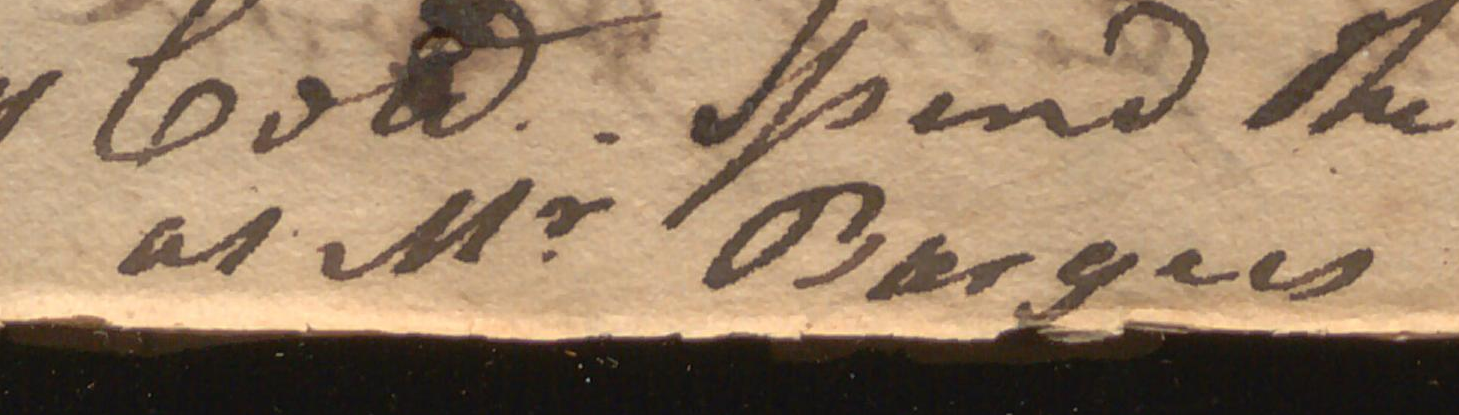at M^r. Bargees
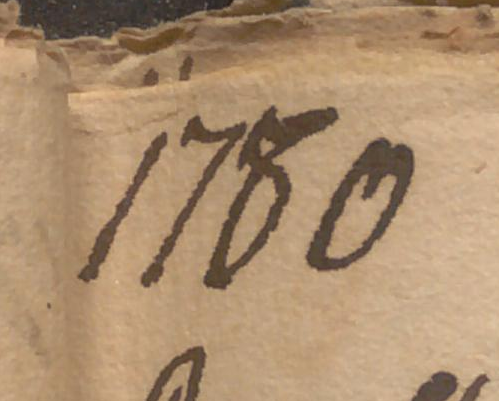1780
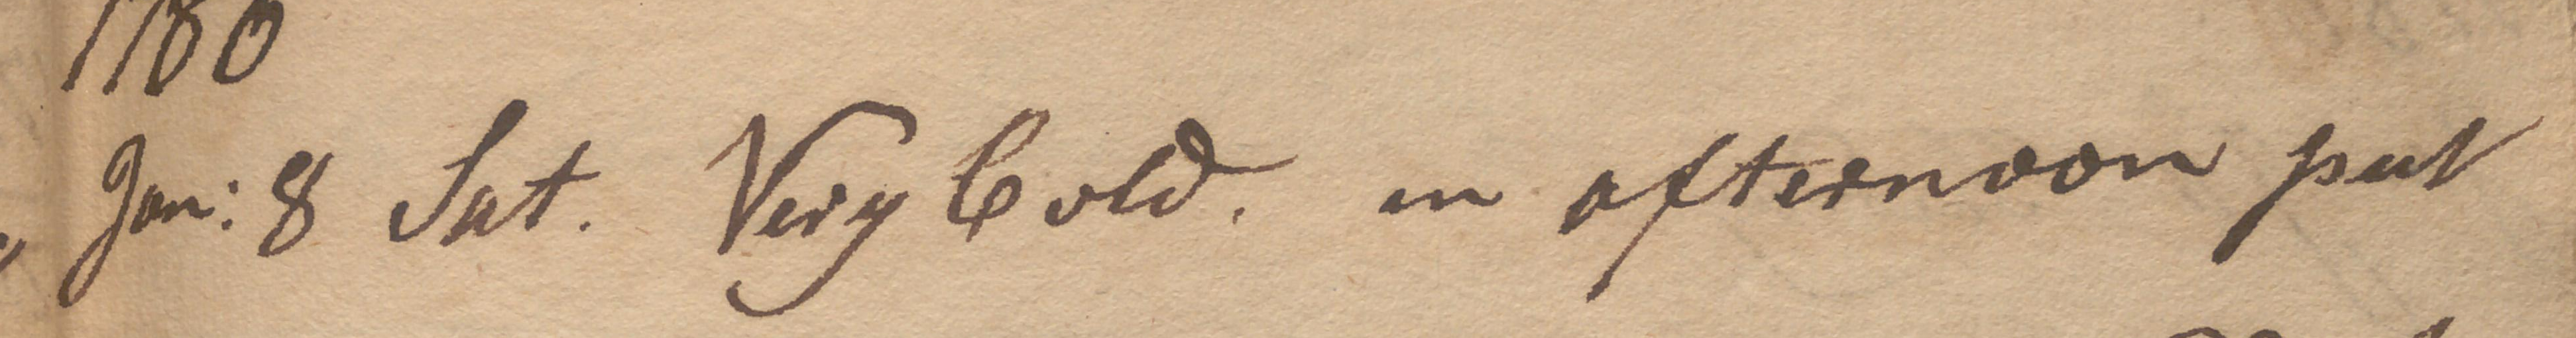Jan: 8 Sat. Very Cold. in afternoon put
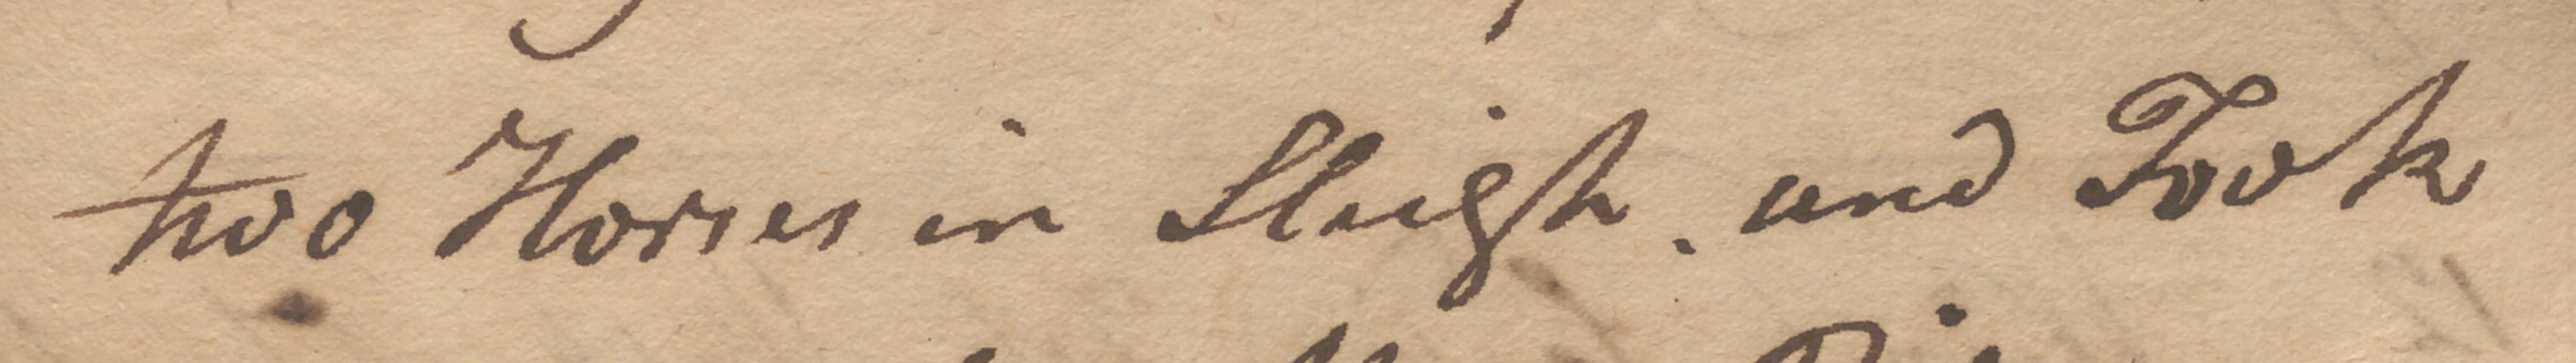two Horses in Sleigh, and Took
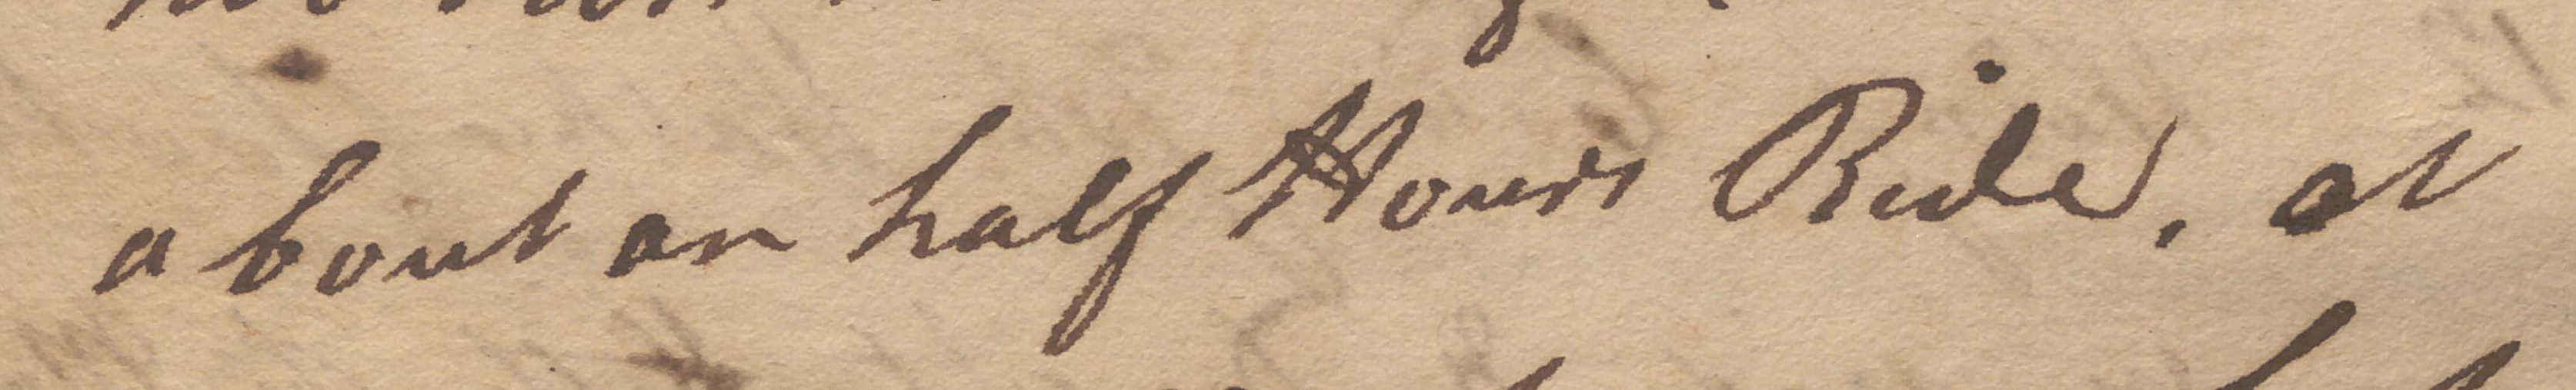about an half Hours Ride, at
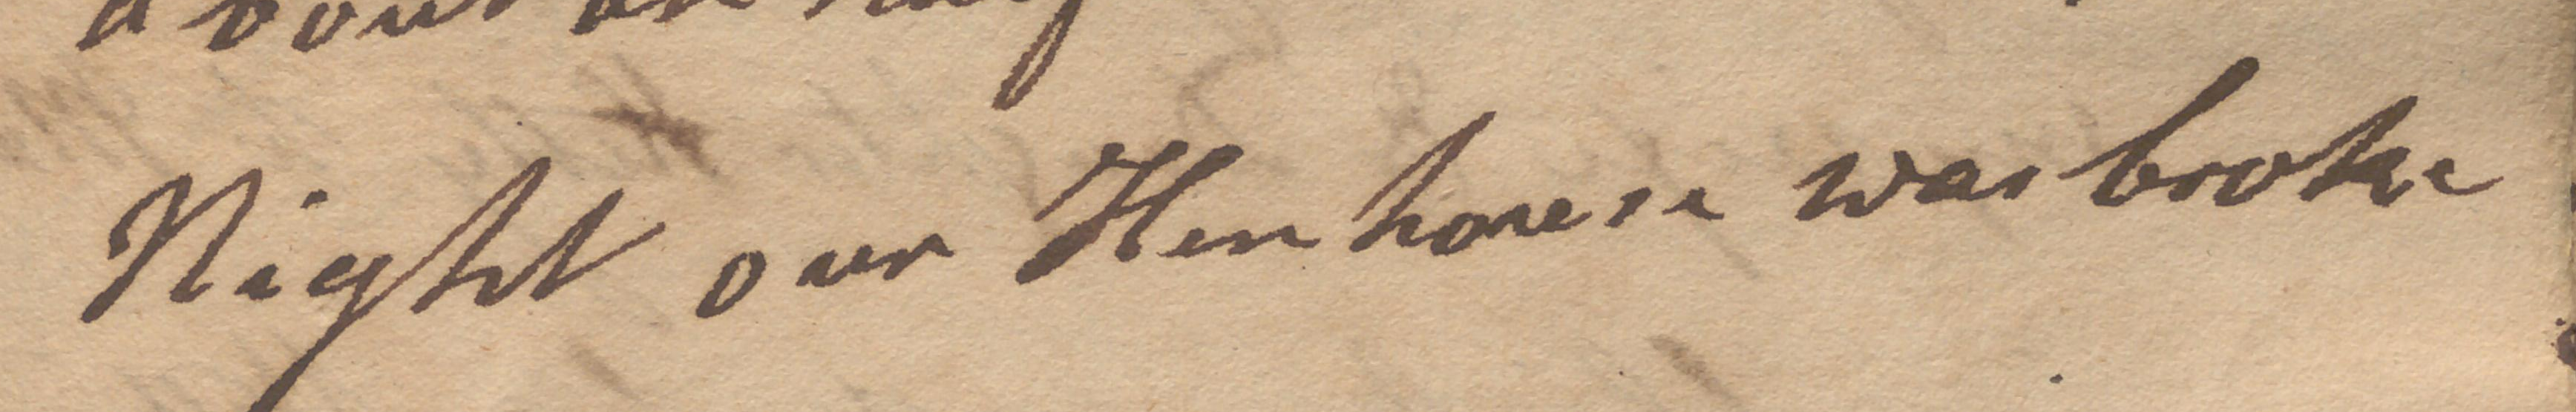Night our Hen houses was broke
